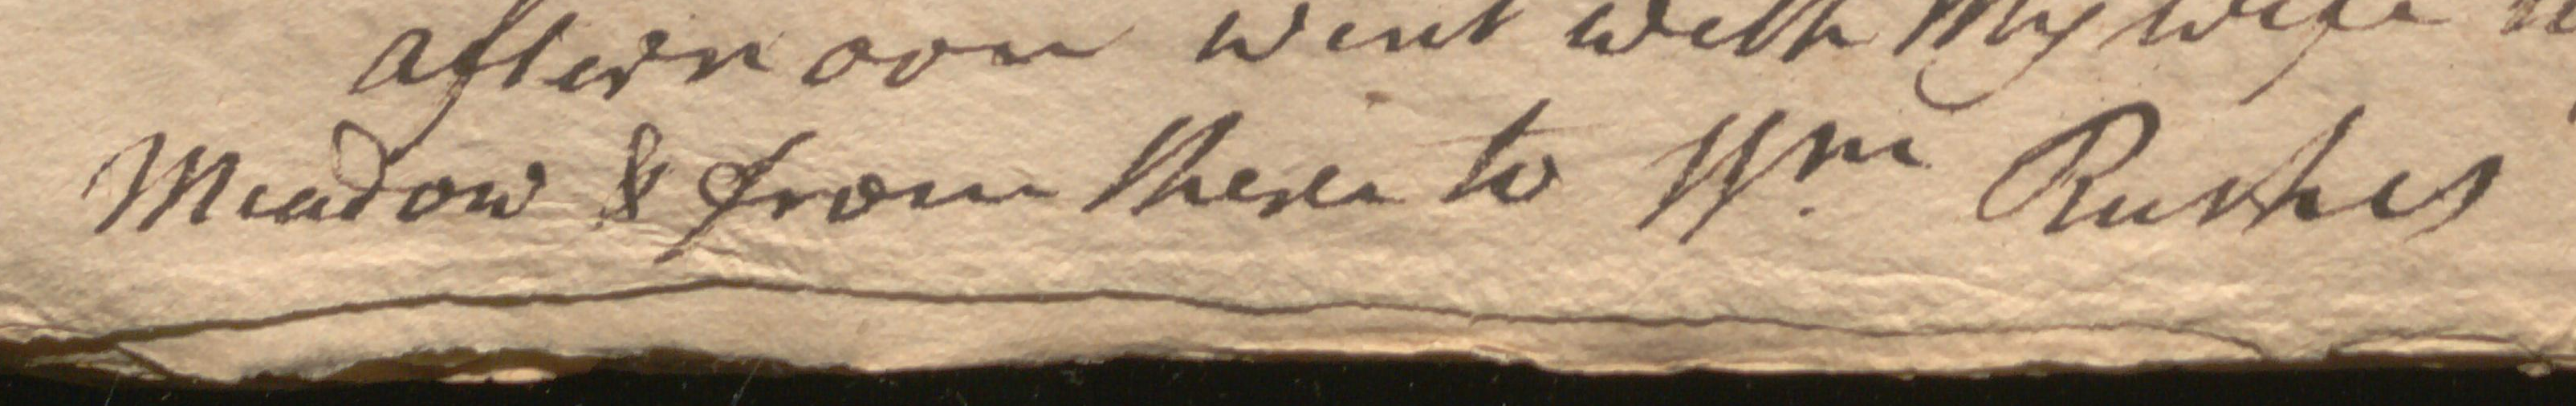Meadow & from there to W^m. Rushes
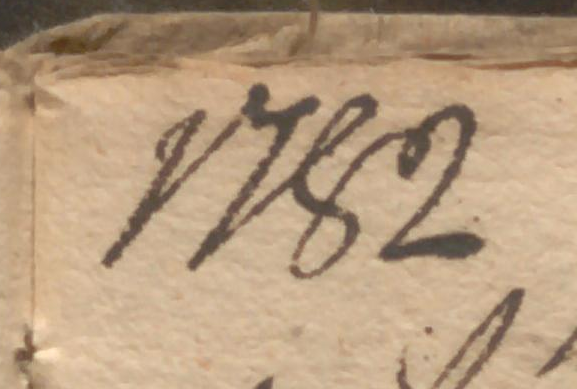1782
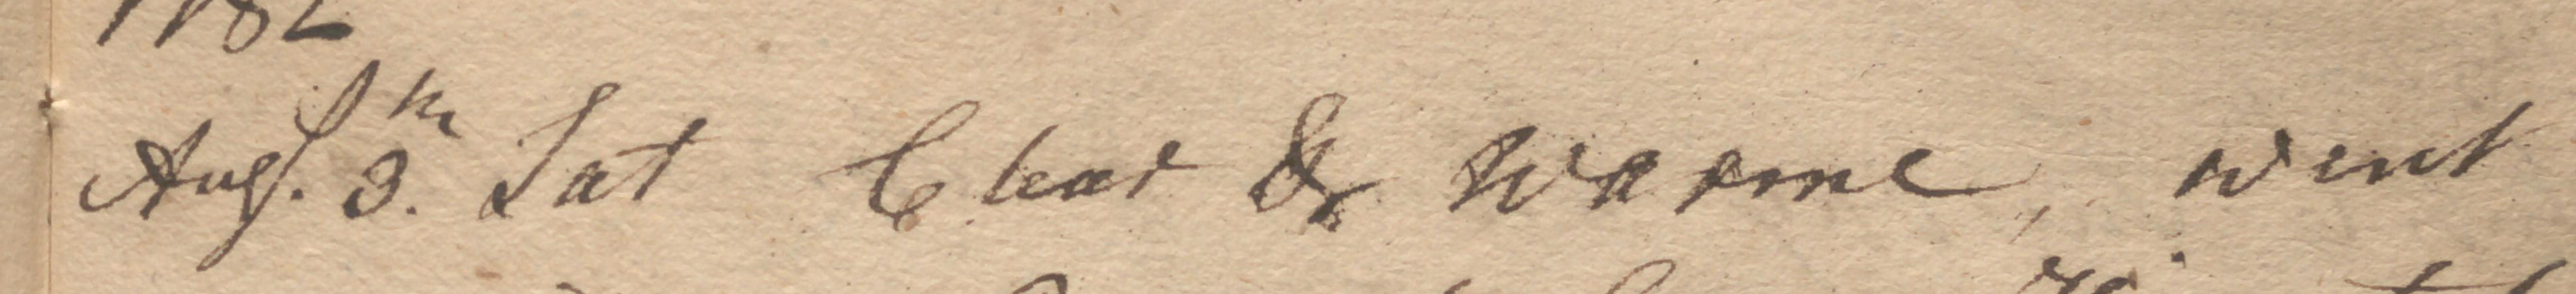Aug^t. 3. Sat Clear & warme, went
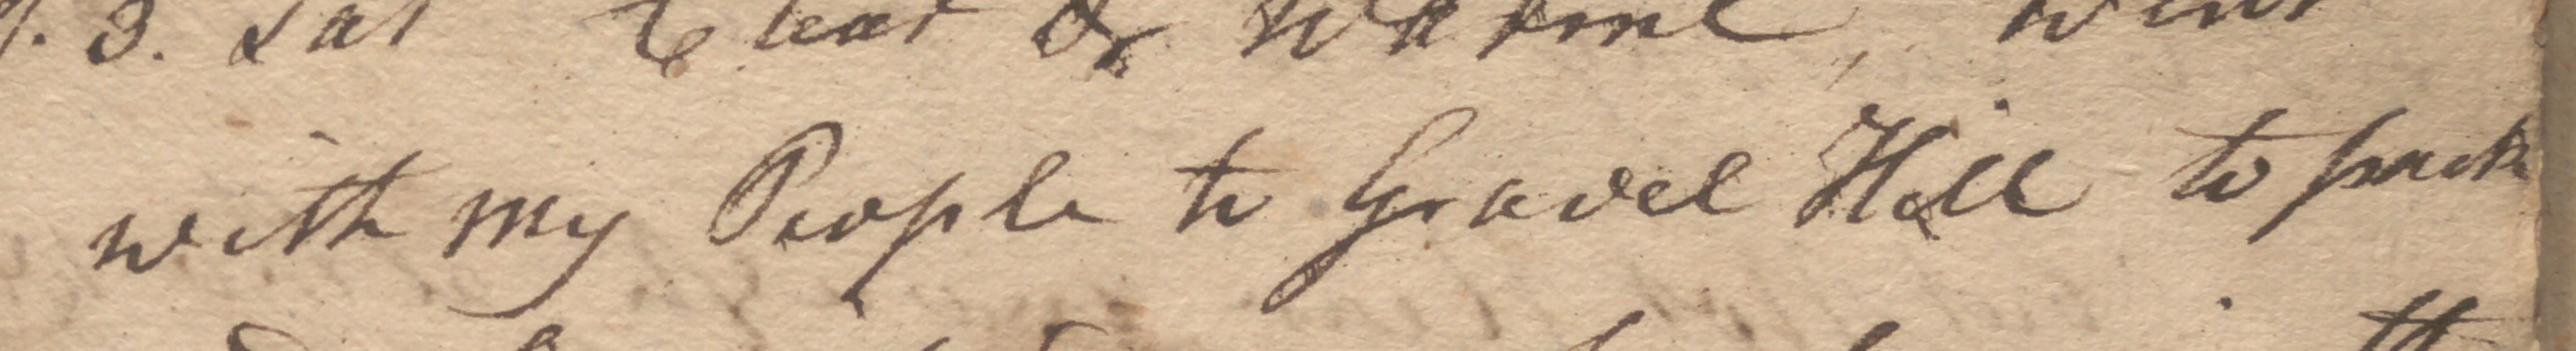with My People to Gravel Hill to pack
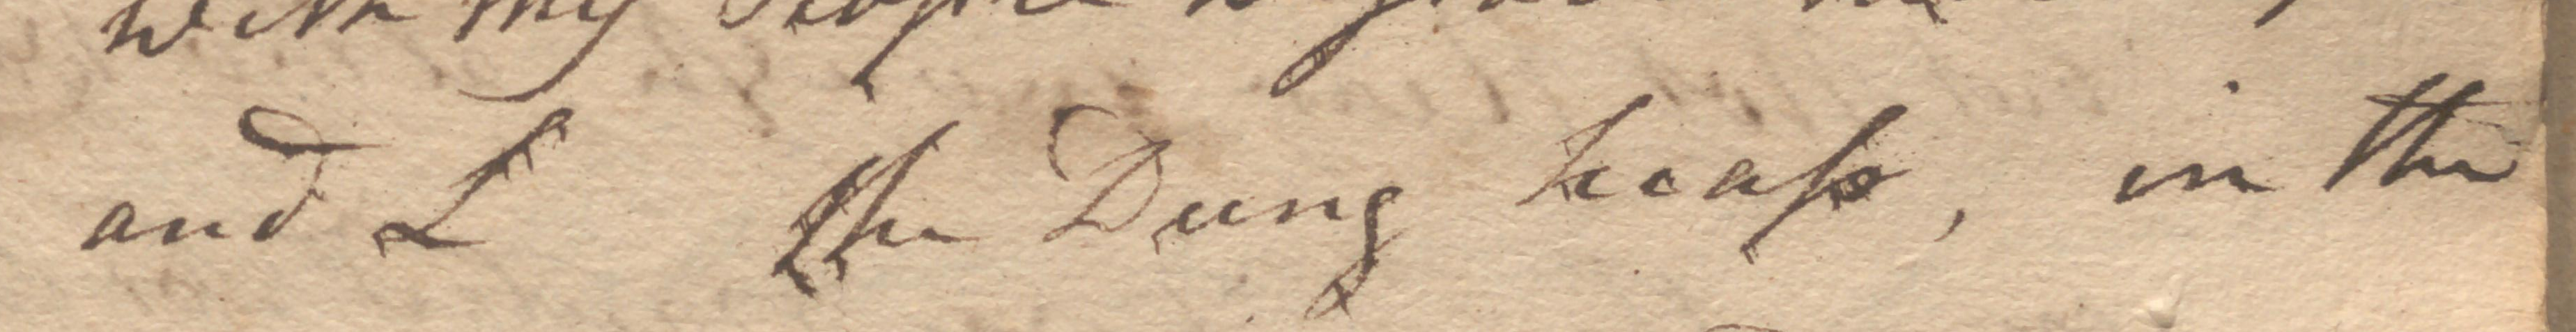and L the Dung heap, in the
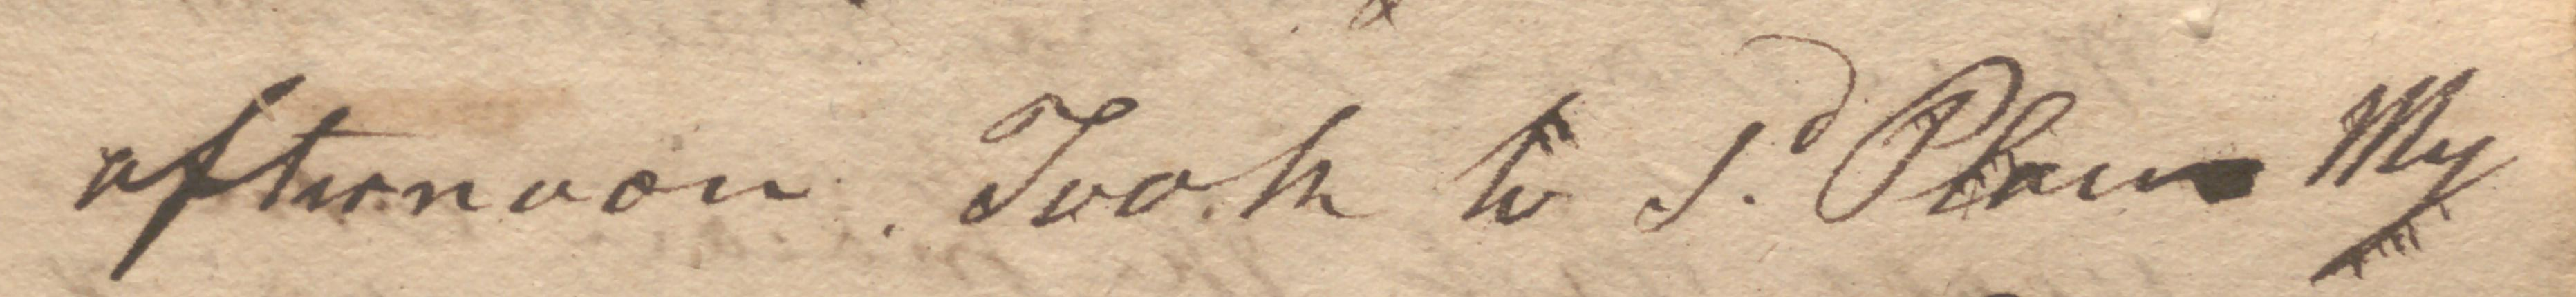afternoon. Took to s^d. Place My
